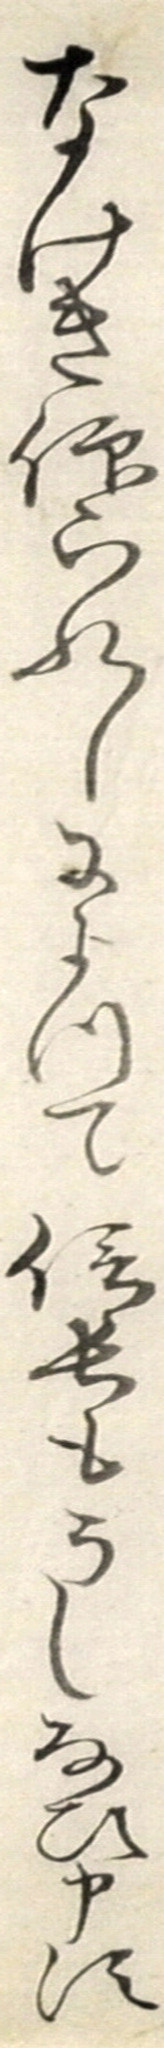なけき仰られしによつて信長もうしなひ申す
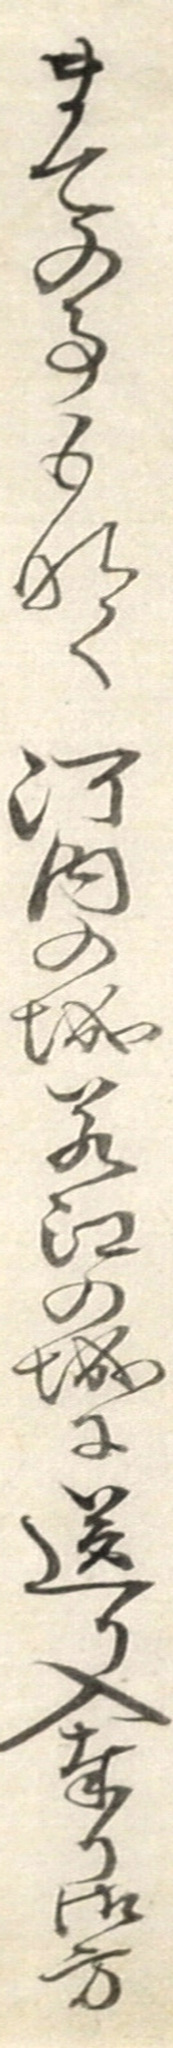まての事もなく河内の城若江の城に送り入奉り御方
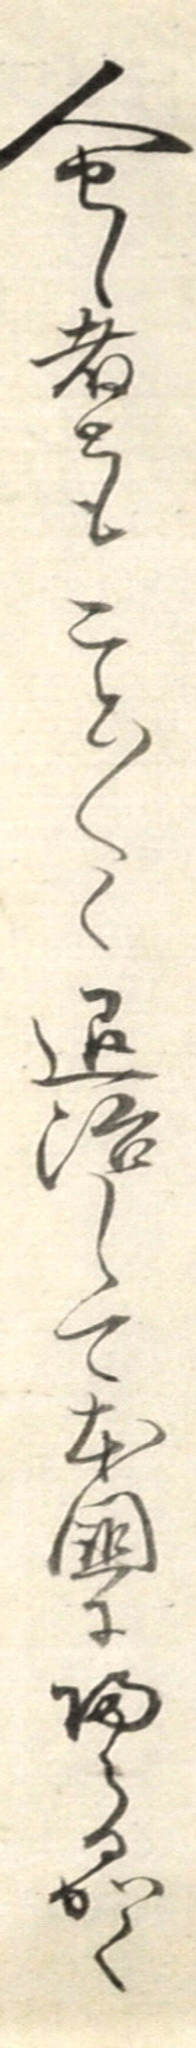人せし者ともこと〳〵く退治して本国に帰らるかく
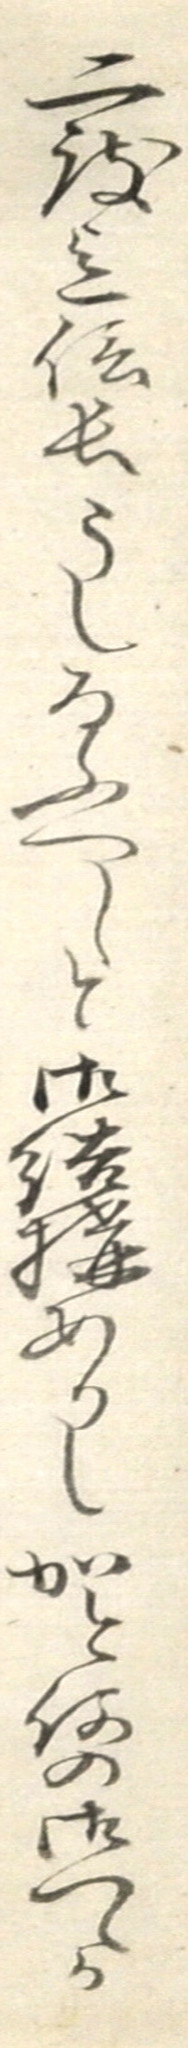二度迄信長うしなふへしと御結構ありしかと何の御つゝか
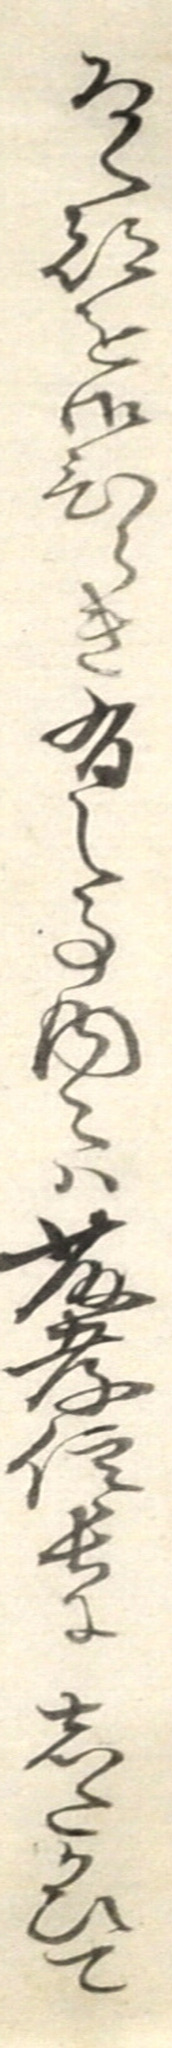なく都を御ひらき有し事内々は藤孝信長にしたかひて
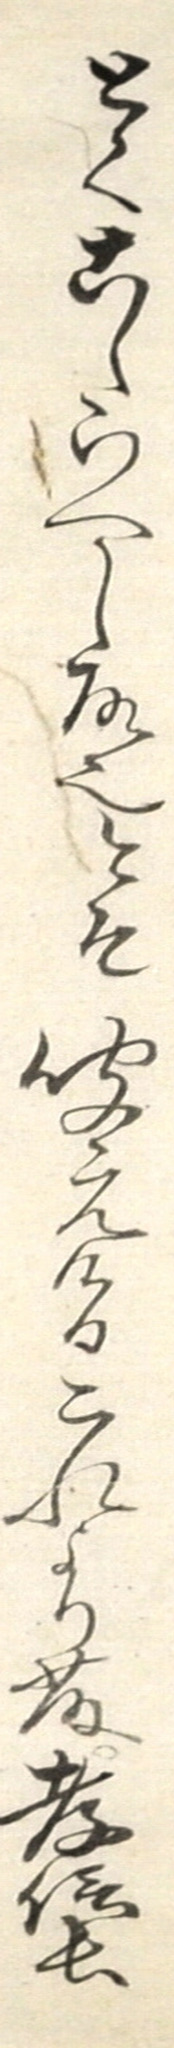とくこしらへし故也とそ聞えけるこれより藤孝信長
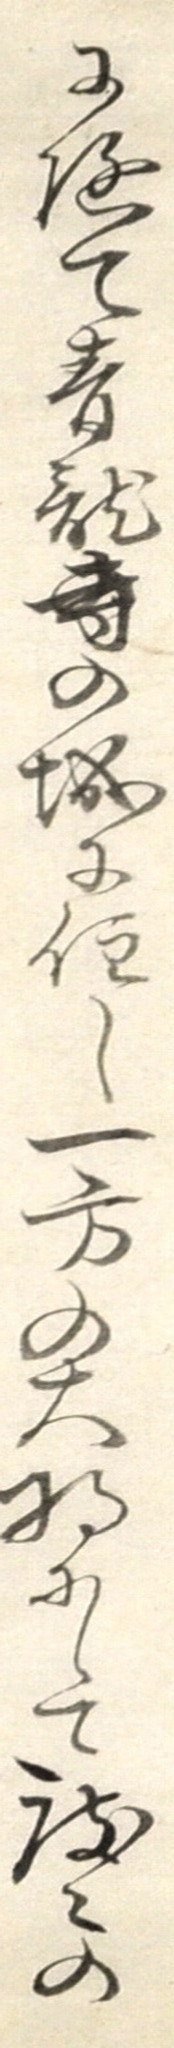に随て青龍寺の城に住し一方の大将にして度々の
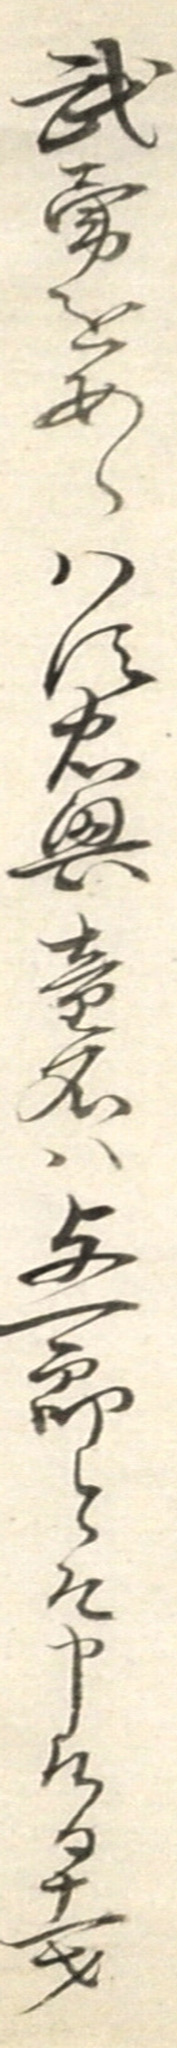武勇をあらはす忠興童名は与一郎とそ申ける十一才
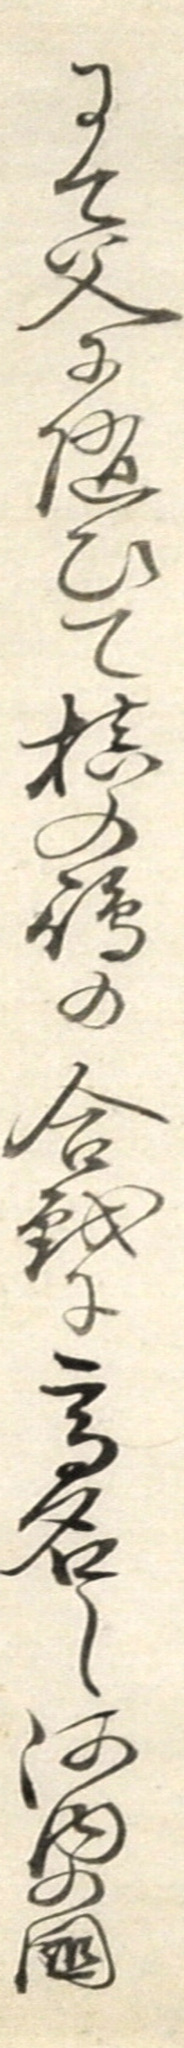にて父に随ひて槙の島の合戦に高名し河内の国
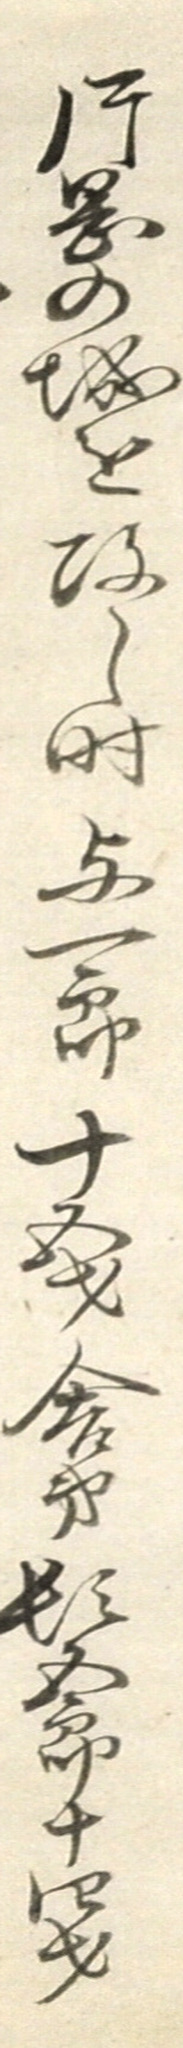片岡の城を攻し時与一郎十五才舎弟頓五郎十四才
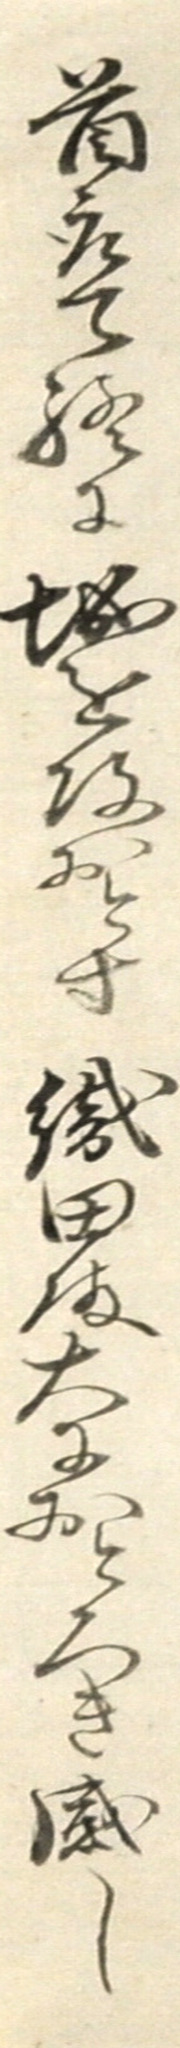首取て終に城を攻おとす織田殿大におとろき感し
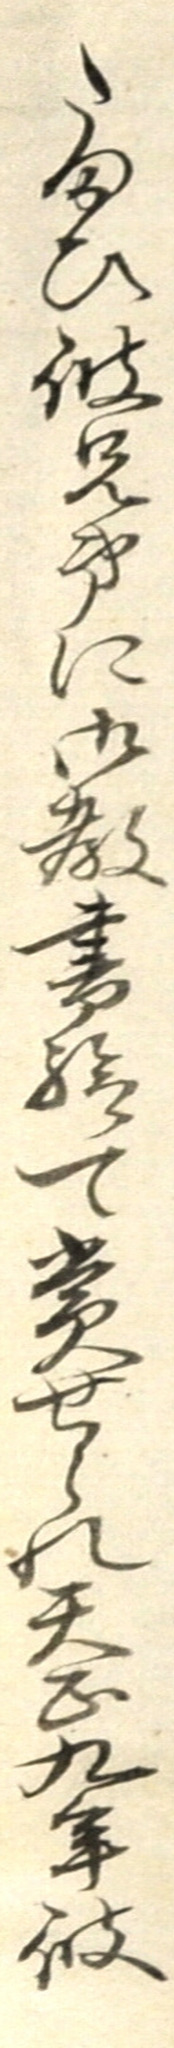たまひ彼兄弟に御教書給て賞せられ天正九年彼

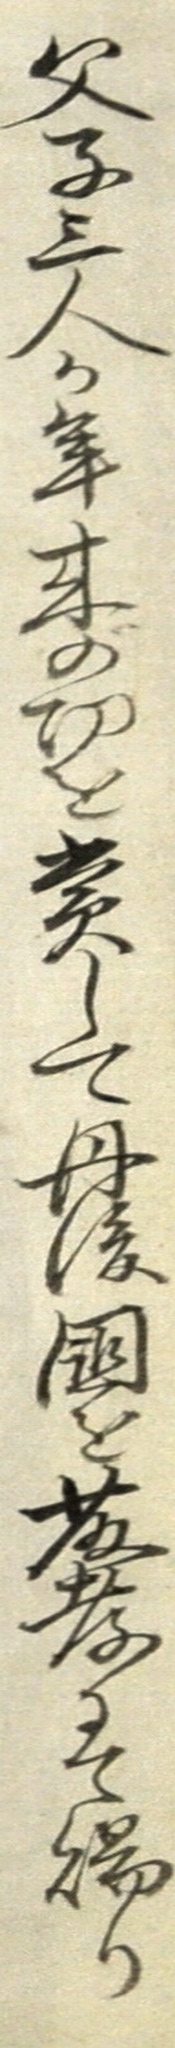父子三人か年来の功を賞して丹後国を藤孝にて賜り
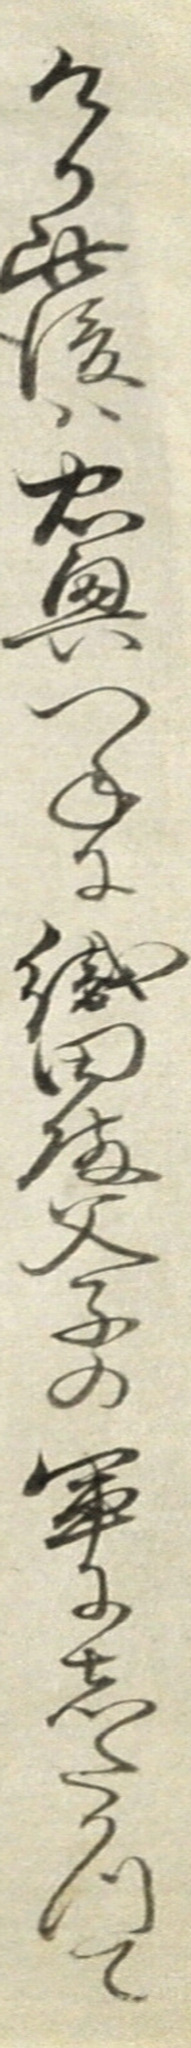けり此後は忠興つねに織田殿父子の軍にしたかつて
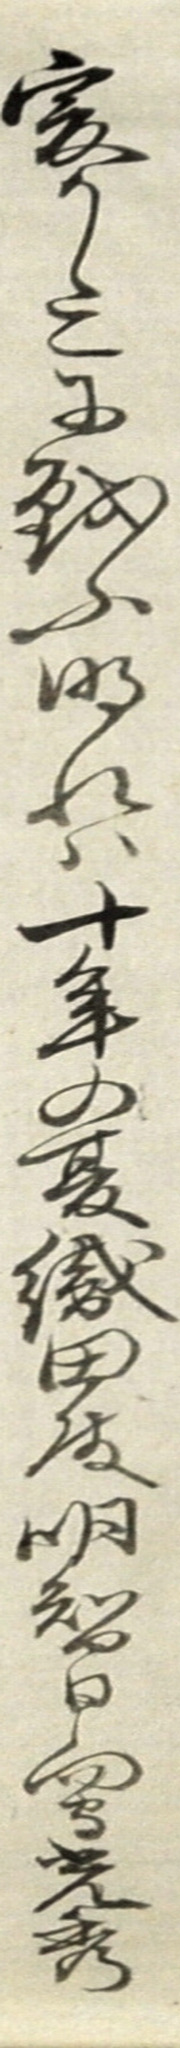爰かしこに戦ふ明れは十年の夏織田殿明智日向守光秀
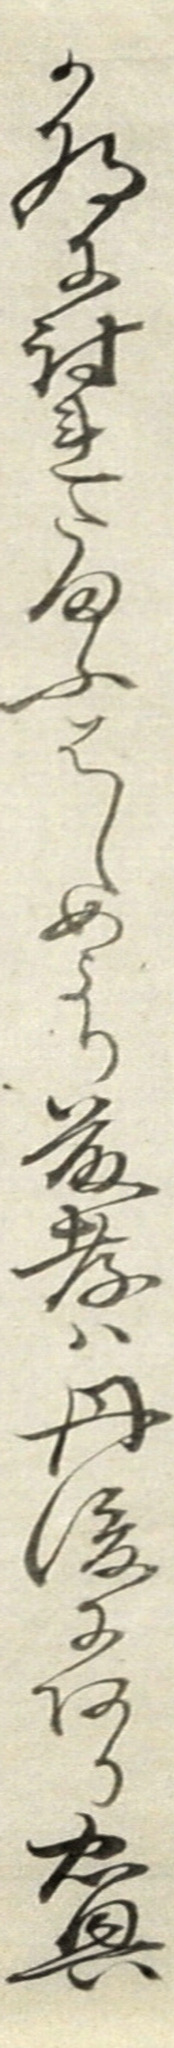か為に討れたまふはしめより藤孝は丹後にあり忠興
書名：藩翰譜（七・下）
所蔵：伊那市立高遠町図書館・合同会社AMANE
